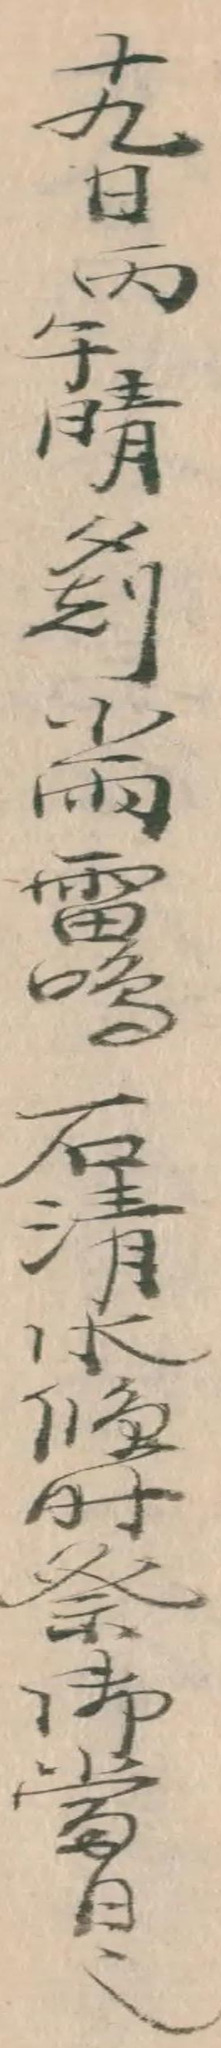十九日丙午晴夕刻小雨雷鳴石清水臨時祭御當日也
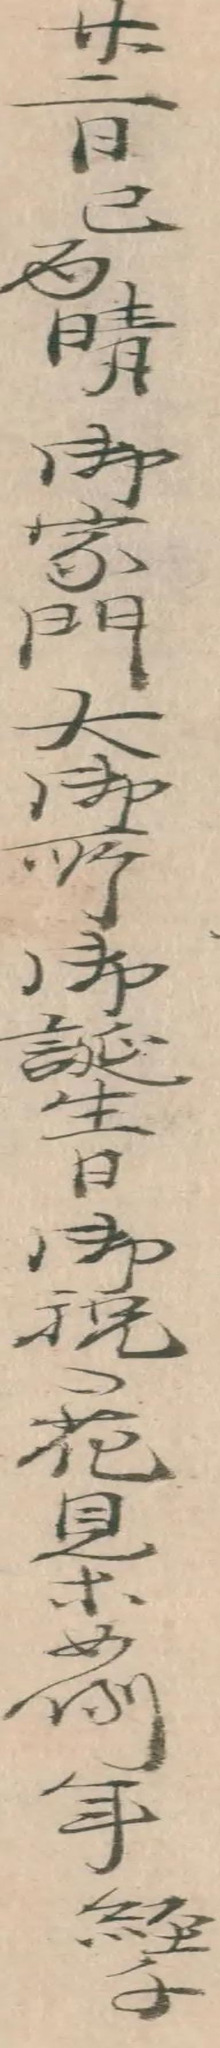廿二日己卯時御家門大御所御誕生日御祝御花見等如例年終千
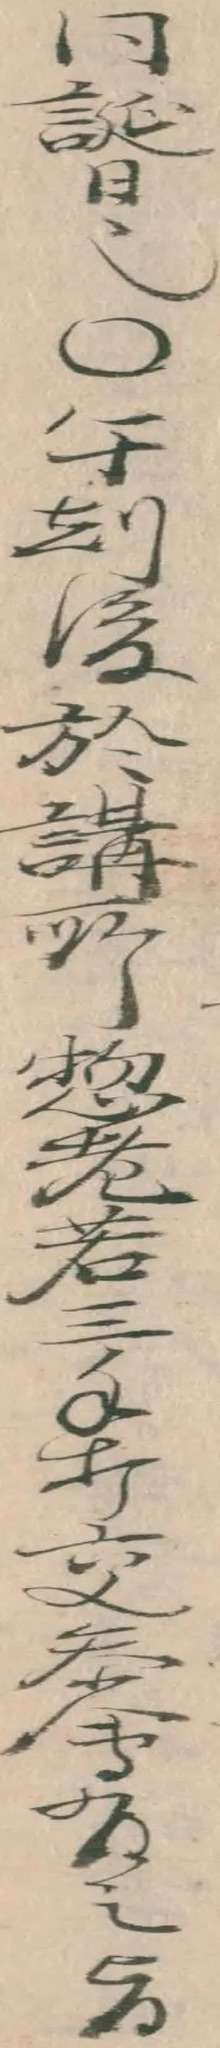同誕日也○午刻後於講所惣老若三手打交参會有之旨
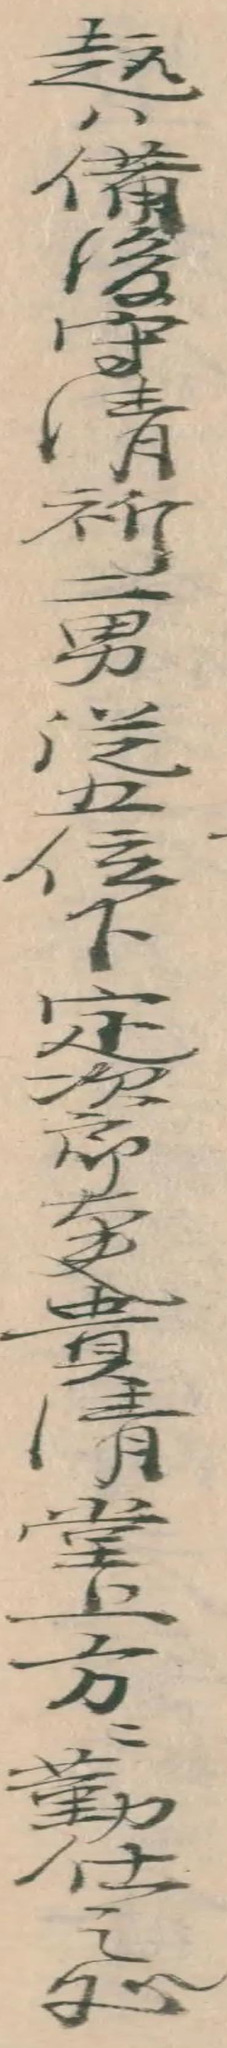趣ハ備後守清祈二男従五位下定次郎大夫貴清堂上方ニ勤仕之処
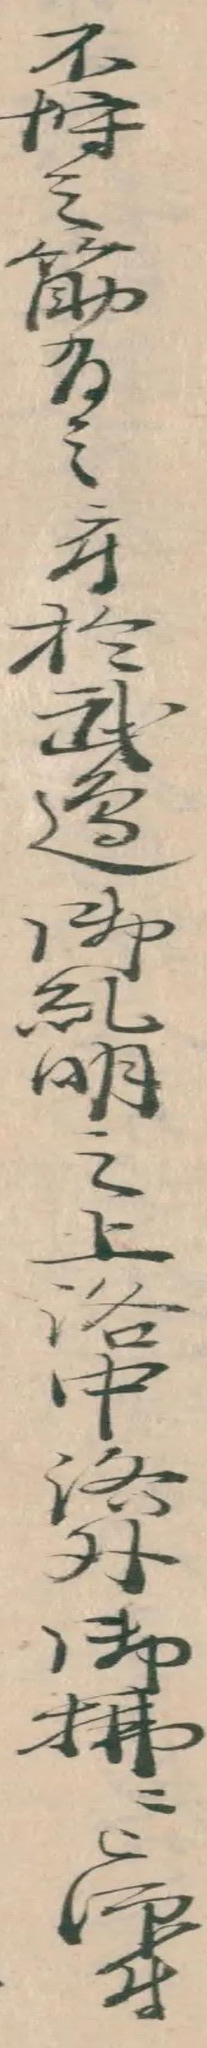不埒之筋有之ニ付於武邊御糺明之上洛中洛外御払ニ被仰付
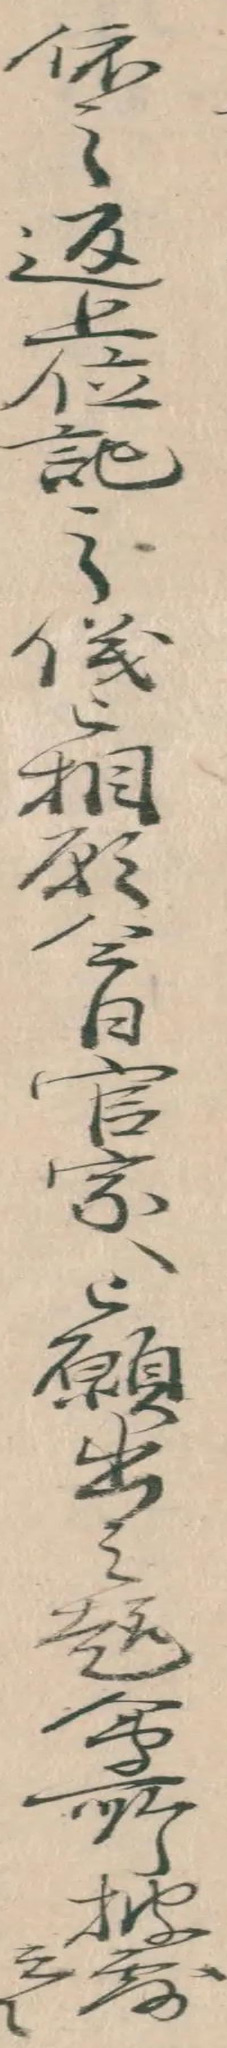依之返上位記之儀ニ被相願今日官家へ被願出之趣會所披露云々
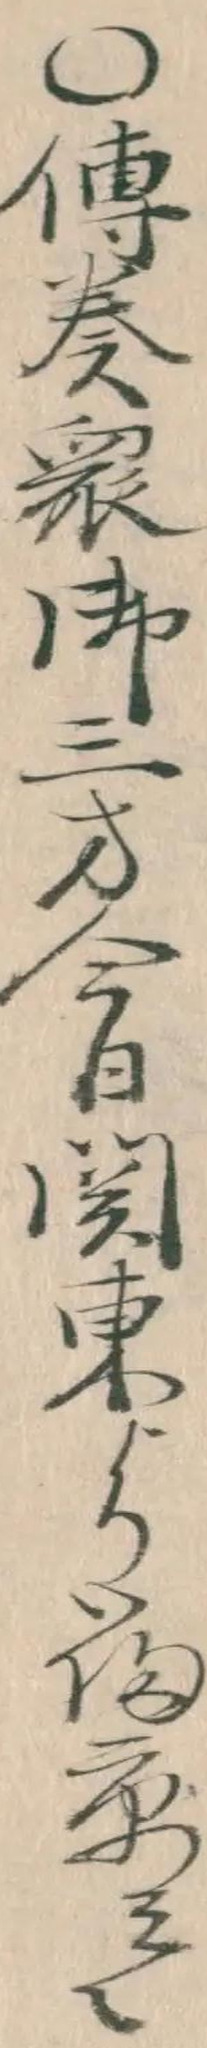○伝奏衆御三方今日関東より御帰京云々
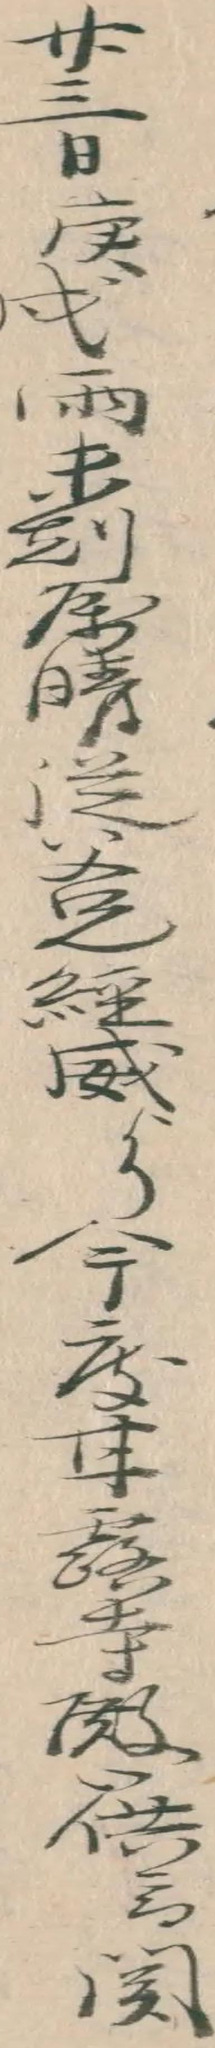廿三日庚戌雨未刻属晴従父兄経威より今度甘露寺殿御供ニ而関
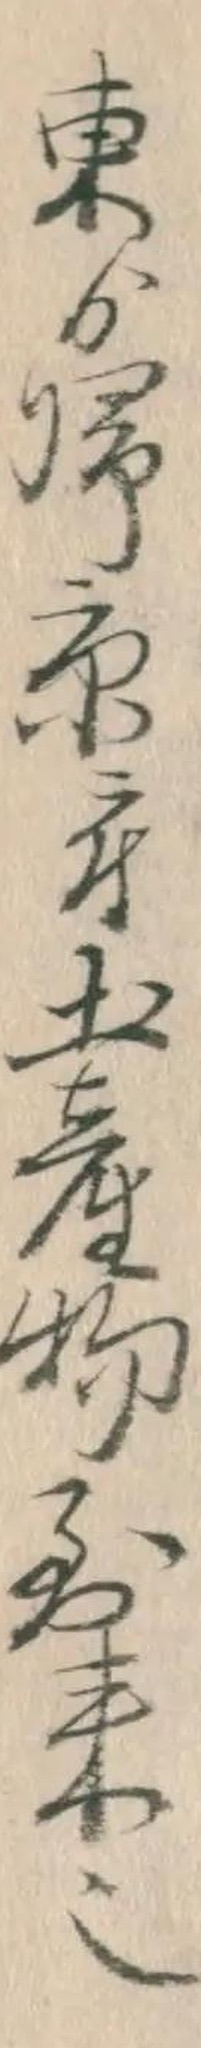東ゟ帰京ニ付土産物到来也
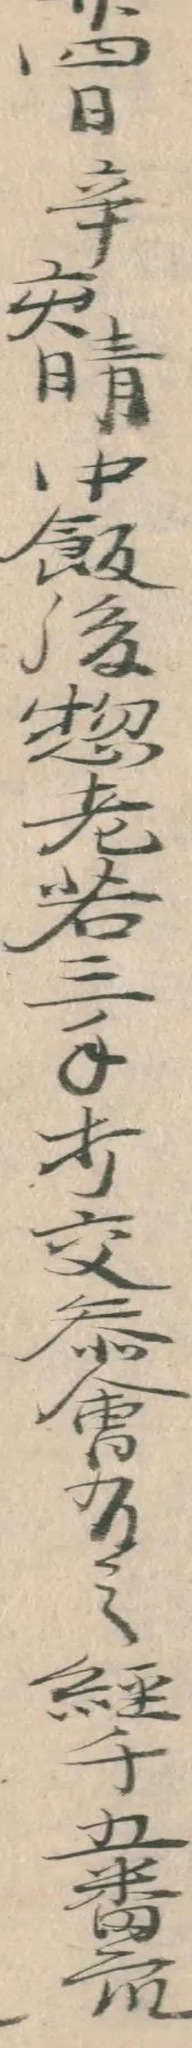廿四日辛亥晴中飯後惣老若三手打交参會有之経千五番衆
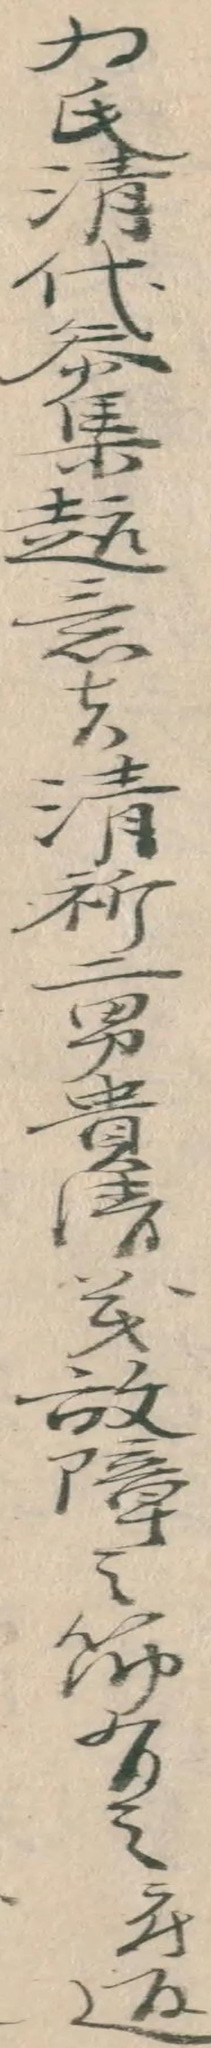為氏清代参集趣意者清祈二男貴清義故障之筋有之ニ付返
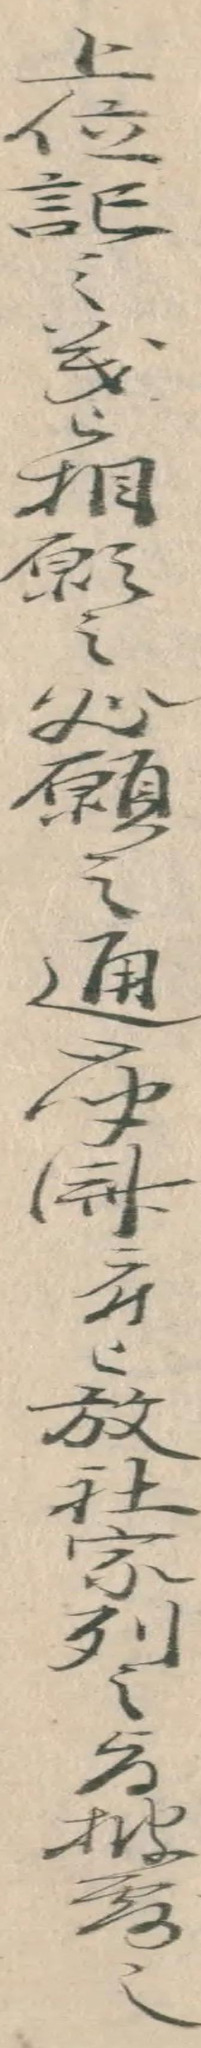上位記之義被相願之処願之通御聞済ニ付放社家列之旨披露也
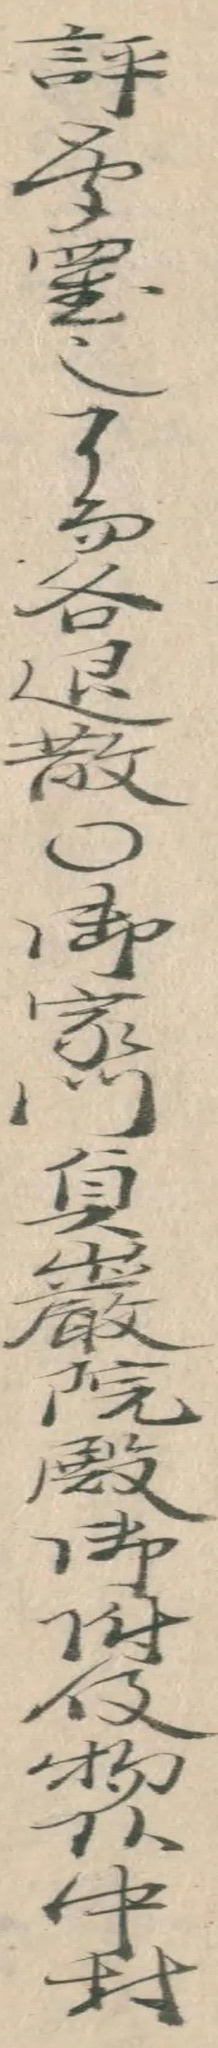評聞置也了而各退散○御家門貞巌院殿御附役物頭中村
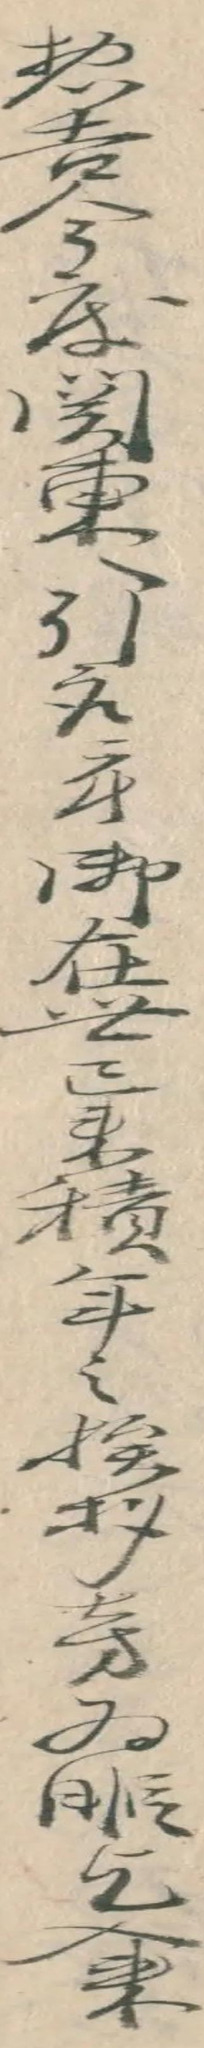惣吉今度関東へ引取ニ付御在世已来積年之挨拶旁為暇乞入来
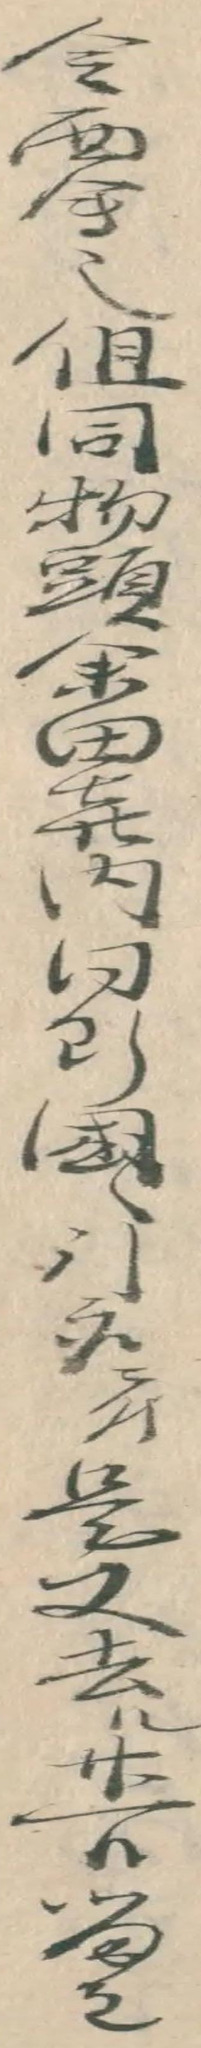令面會也但同物頭余田喜内同断國へ引取ニ付是又去ル廿一日留主

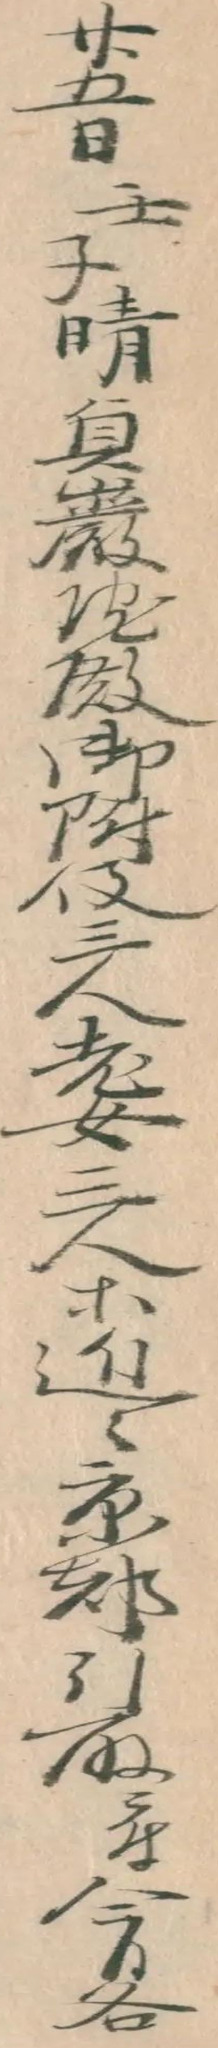廿五日壬子晴貞巌院殿御附役三人老女三人等近々京都引取ニ付今日各
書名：賀茂社記録. 第65冊
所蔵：国立国会図書館 National Diet Library, JAPAN
